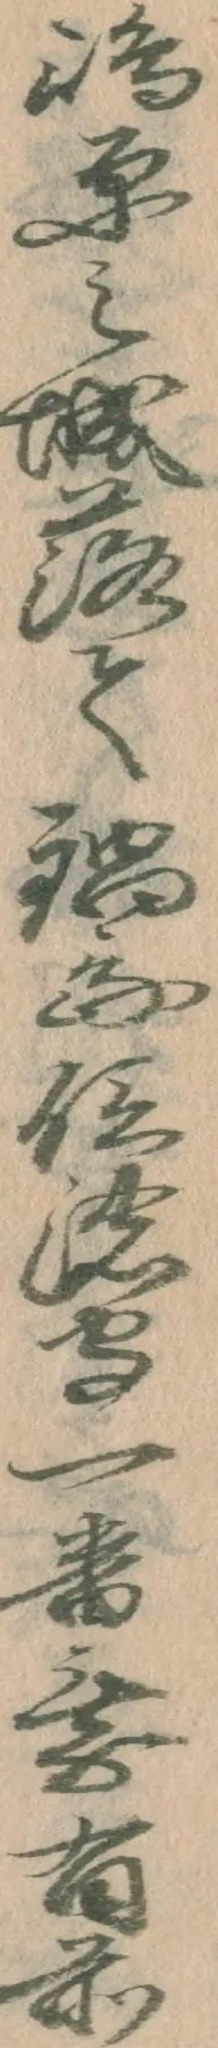島原之城落て鍋島信濃守一番乗有前
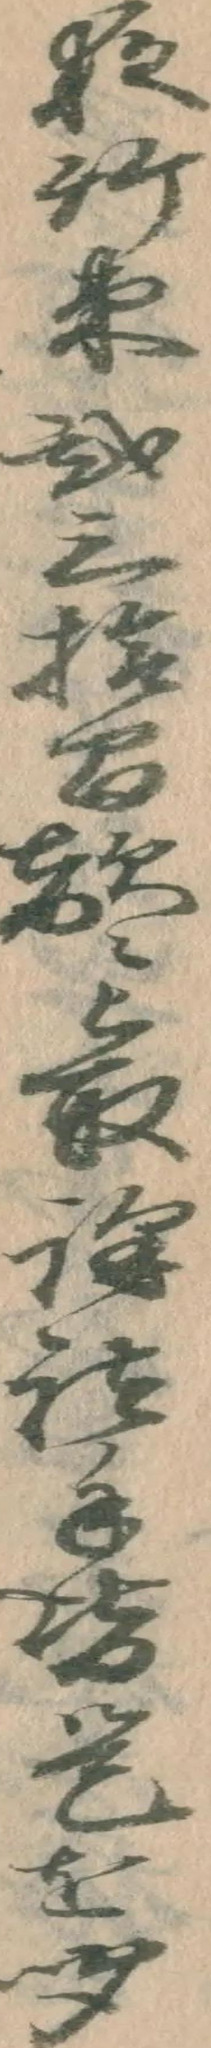夜竹束弐三拾間敵に被取訳諸手皆是を聞
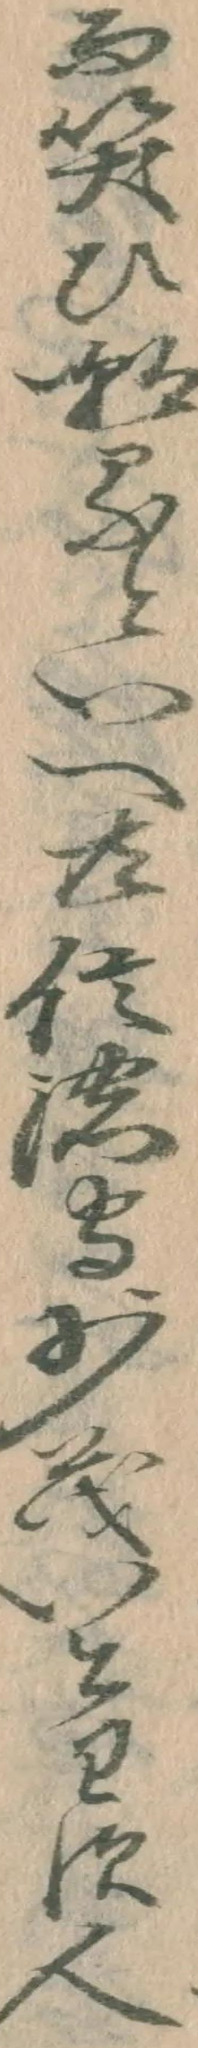而笑ひ嘲累といへ共信濃守少茂いと已須人
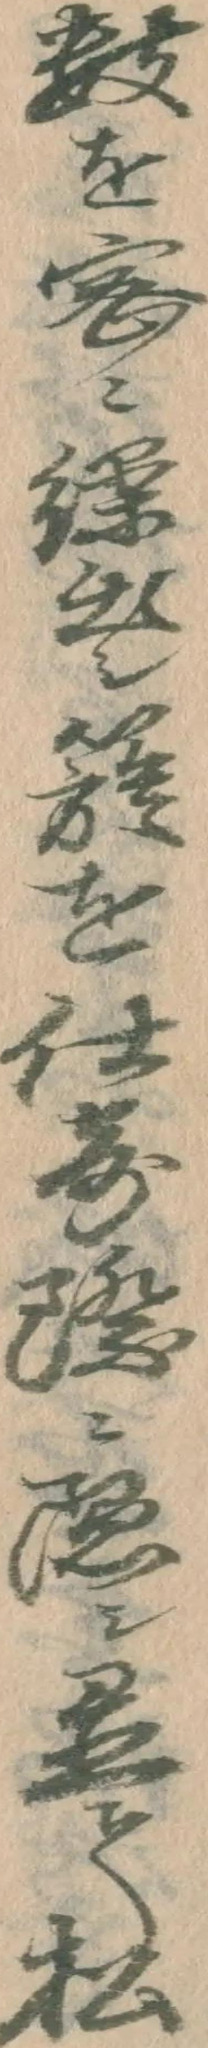数を密に繰出し籏を仕寄際に隠し置て松
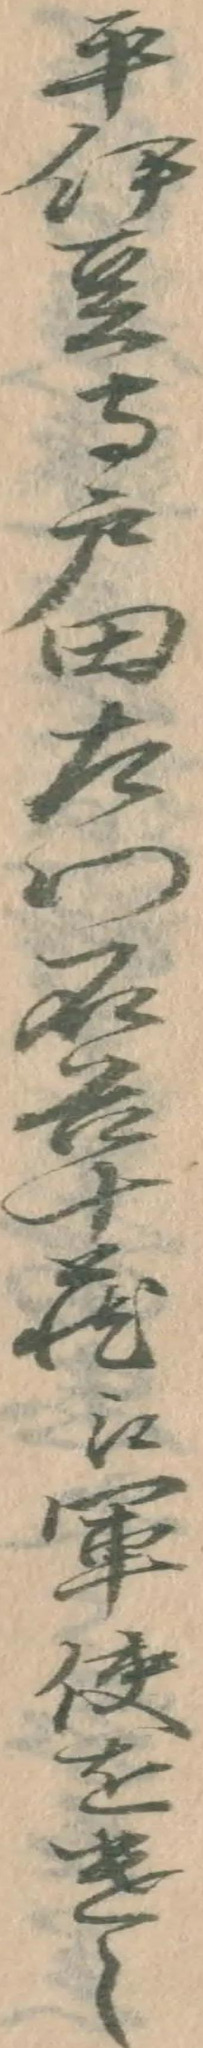平伊豆守戸田左門石谷十蔵江軍使を遣し
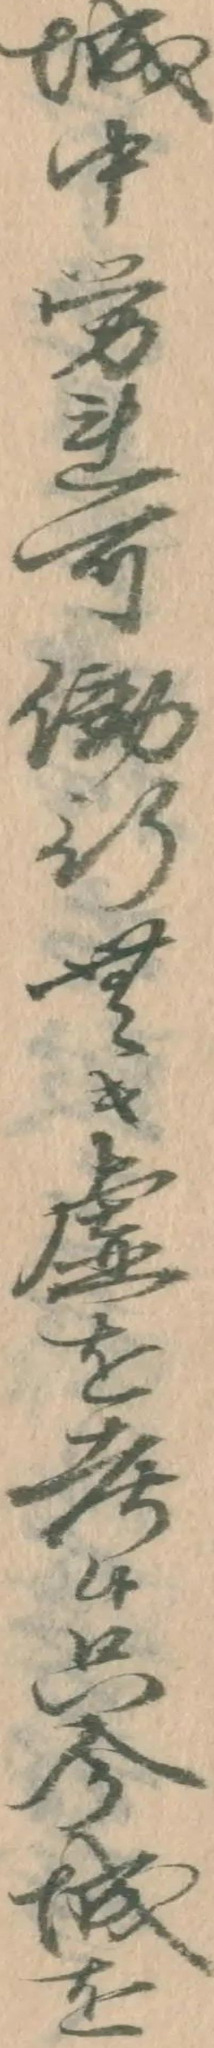城中労連可働行無き虚を考候只今城を

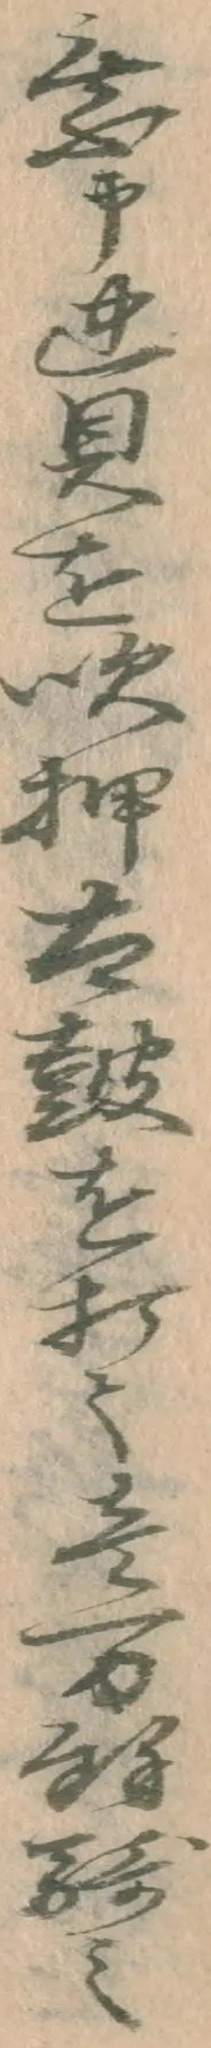乗申迚貝を吹押太皷を打て壱万余騎之
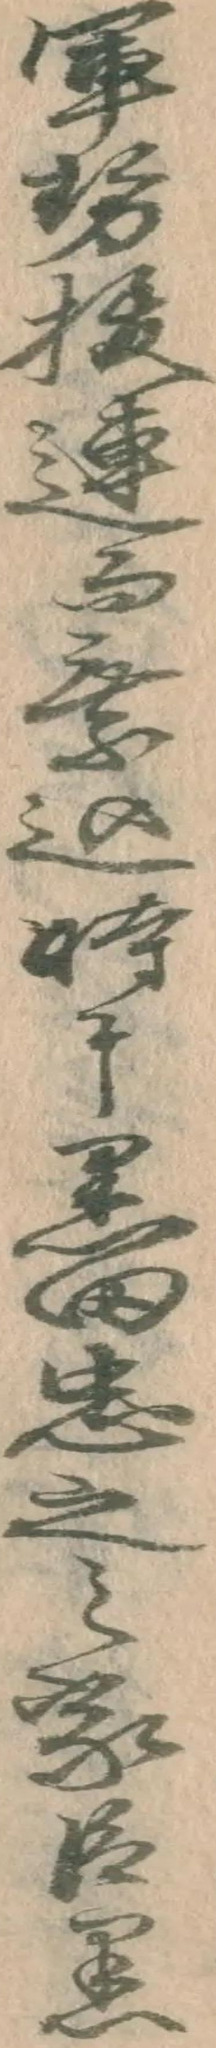軍勢抜連而乗込時干黒田忠之之家臣黒
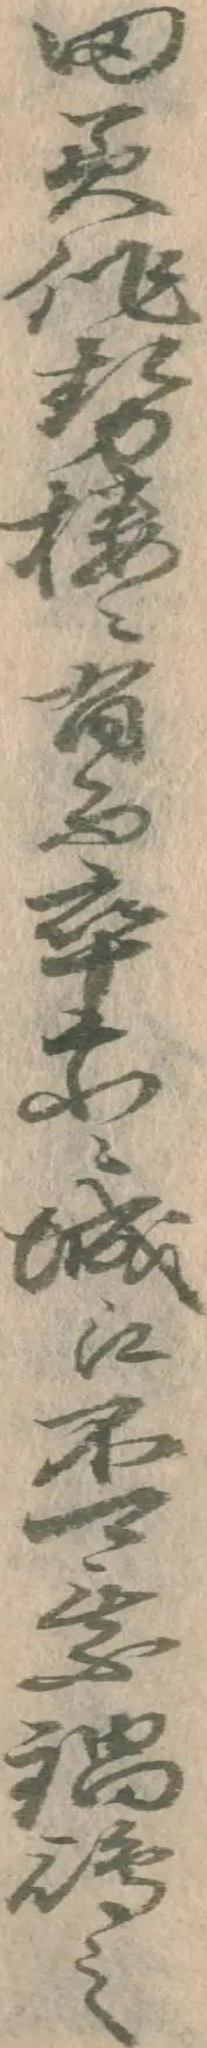田美作勢樓に有而卒原之城江不可乗鍋島之
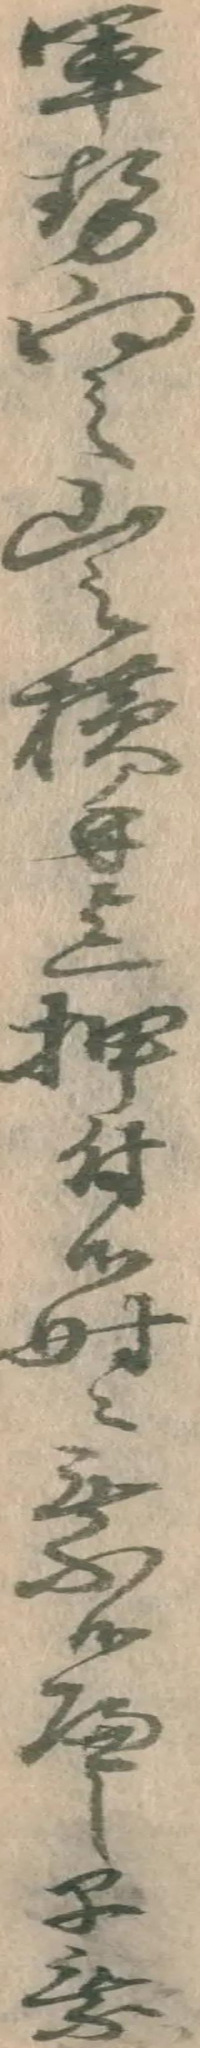軍勢向之山之横手迄押付候時に乗候扁し早乗
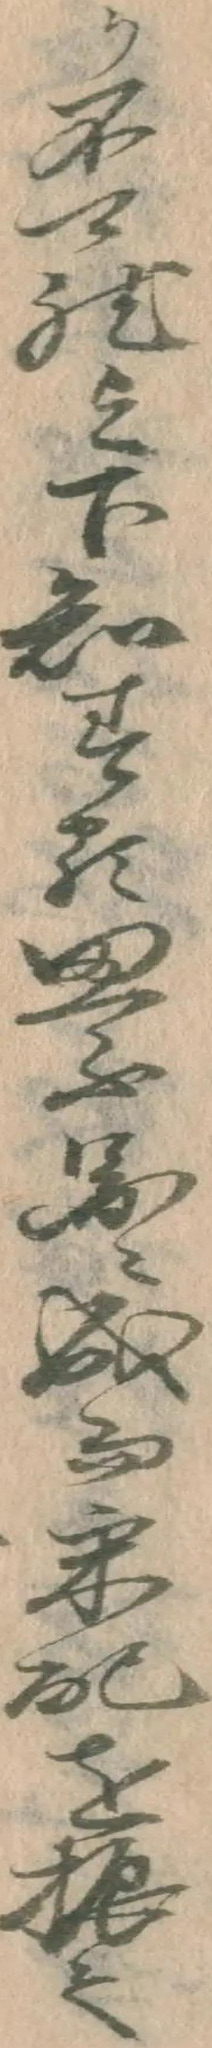り不可然与下知春類思ふ図に成而采配を振て
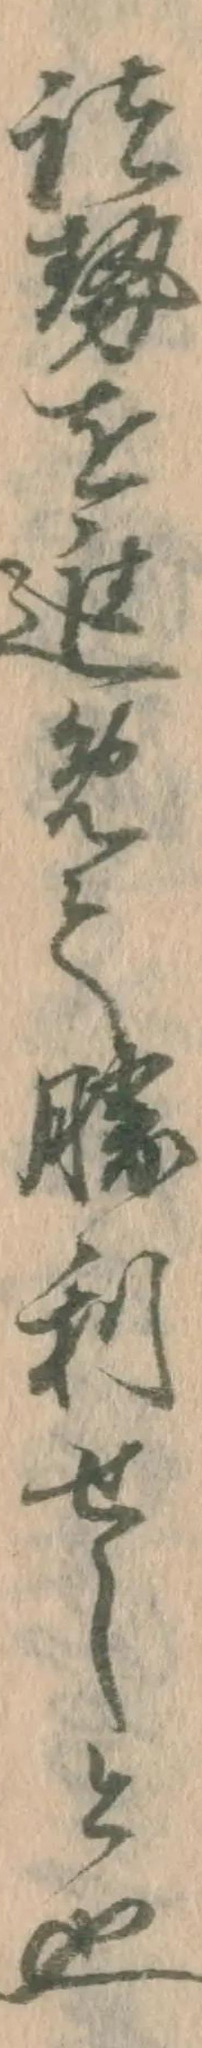諸勢を進免て勝利せしと也
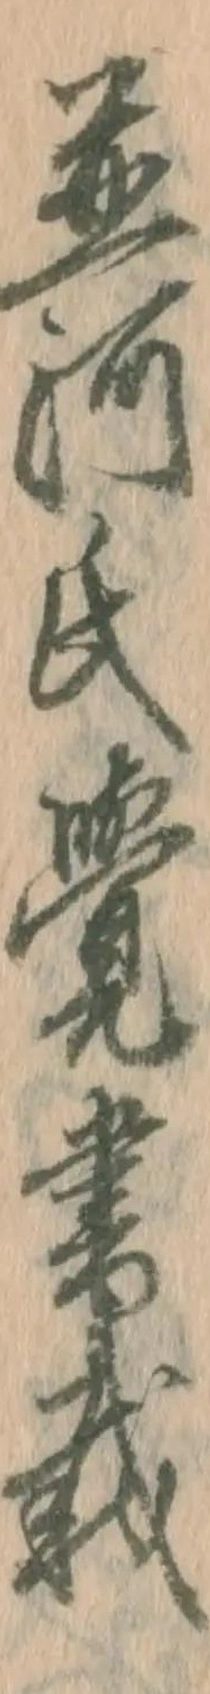並河氏覚書載
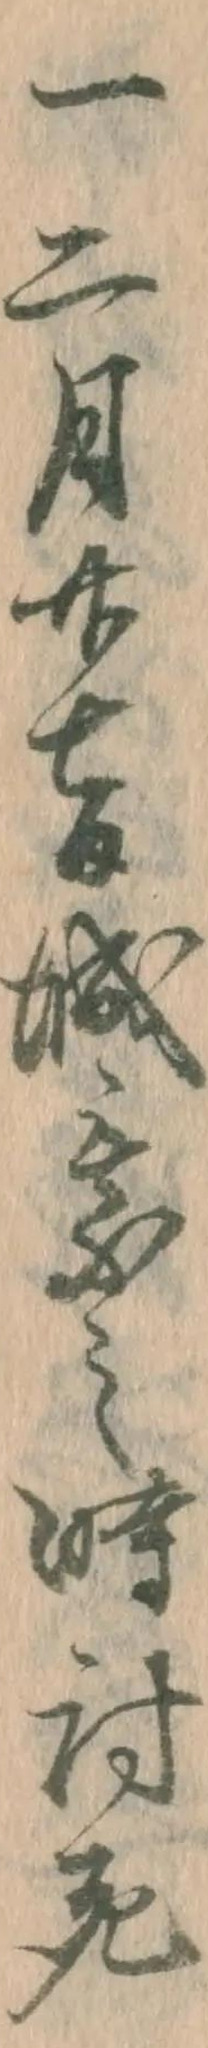一二月廿七日城乗之時討死
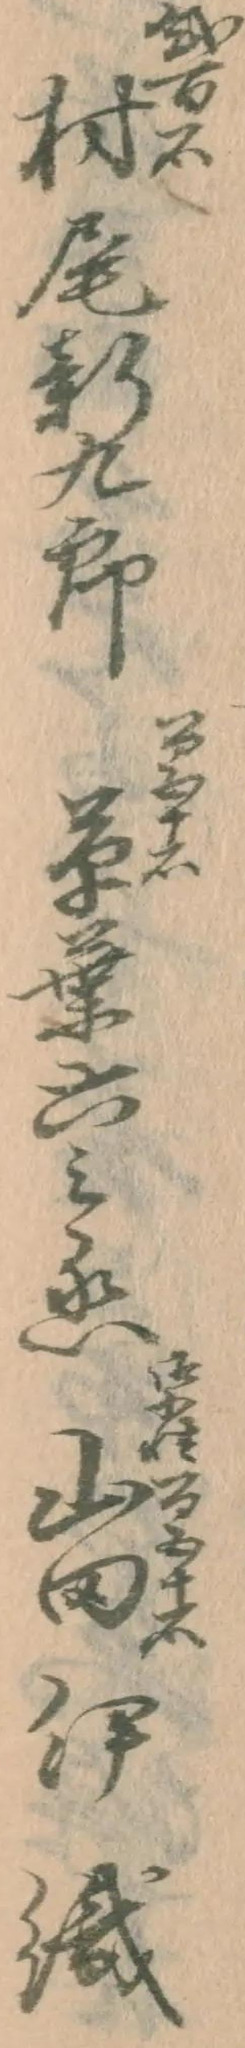村尾新九郎草場六之丞山田伊織
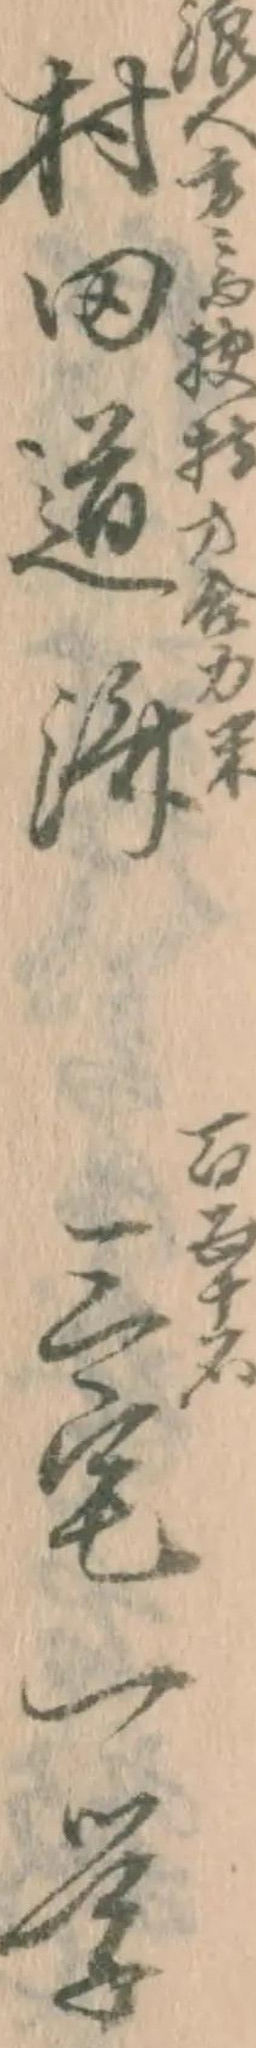村田道済三宅一学
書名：切支丹御退治記 49巻. [8]
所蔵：国立国会図書館 National Diet Library, JAPAN
